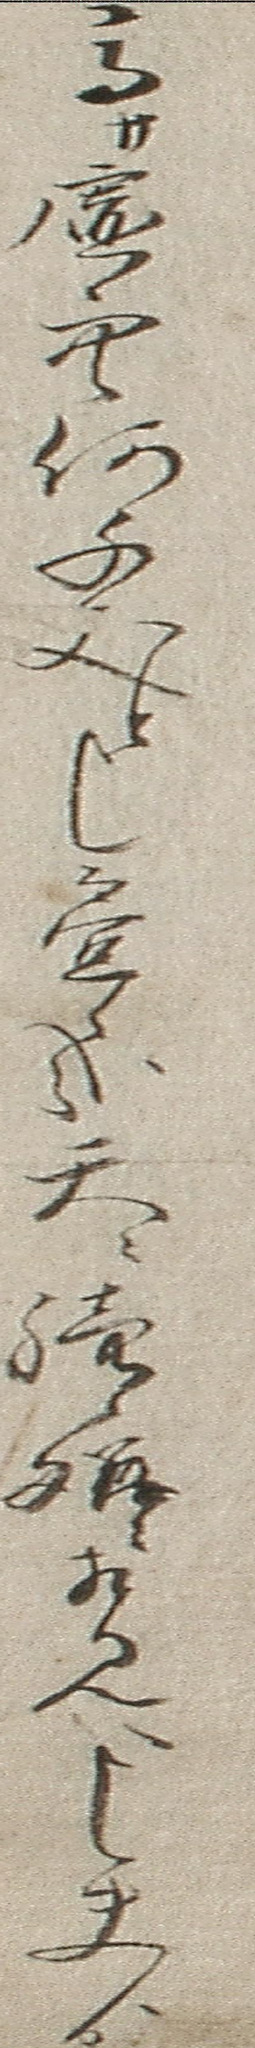高さ虚中何千尺に申候而宜哉天に続候様に相見へ申候夫ゟ

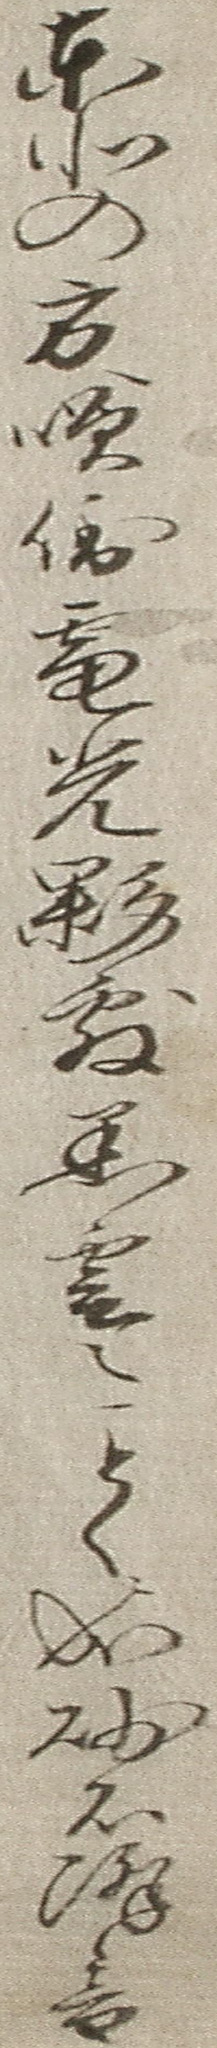東北の方へ吹倒電光夥敷黒雲之ことくに成砂石降音
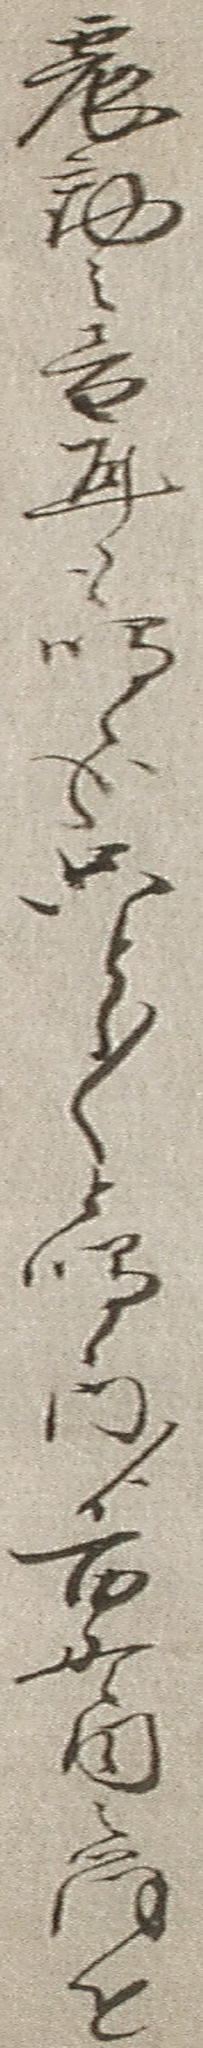震動之音耳も鳴候哉只とう〳〵と鳴候間ゟ百貫目之筒を
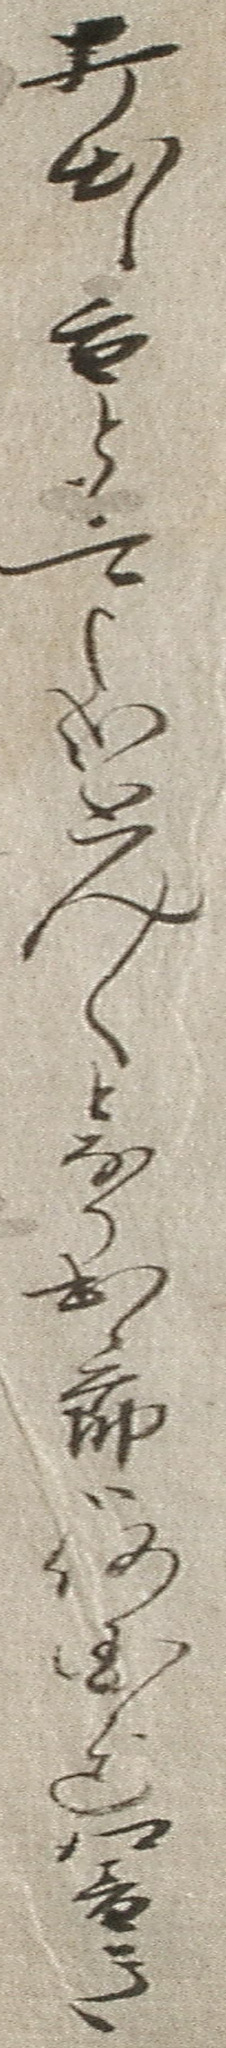打出候音とも可申候哉とん〳〵となり出候節は何国迄響き
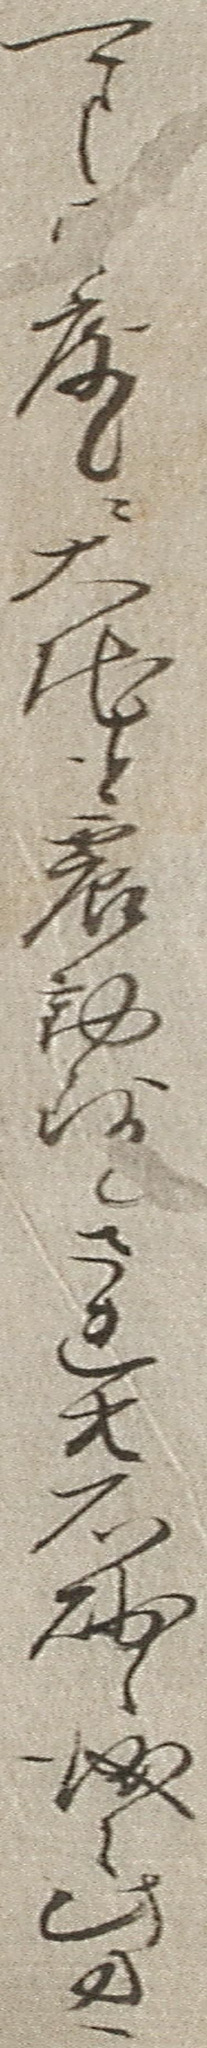可申候度に大地も震動致しされ共石砂之儀も此方へ
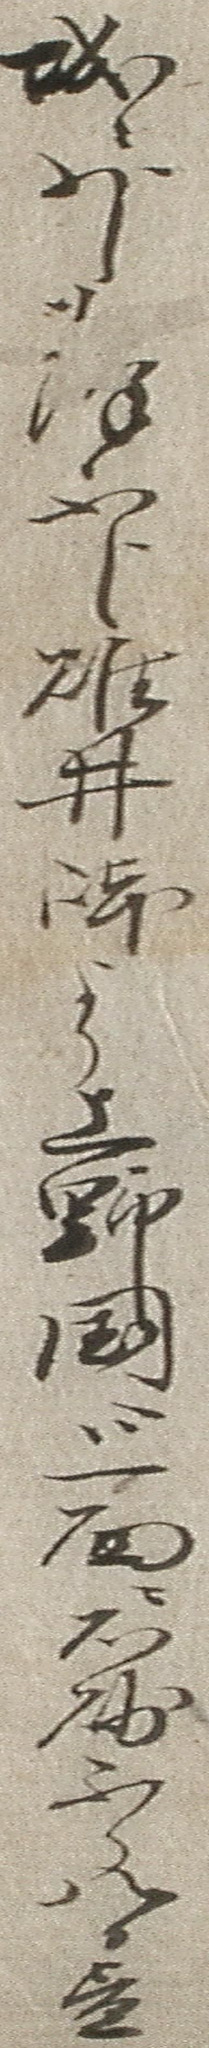城に少しも降不申候碓井峠より上野国へは一面に石砂ふり八日昼
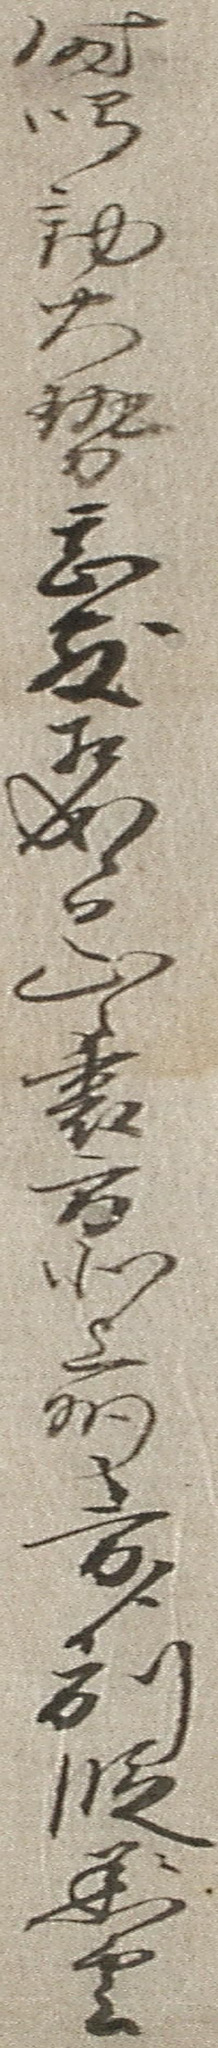時鳴動火勢甚敷相成候而山之裏方北上州之方ゟ別段に黒雲
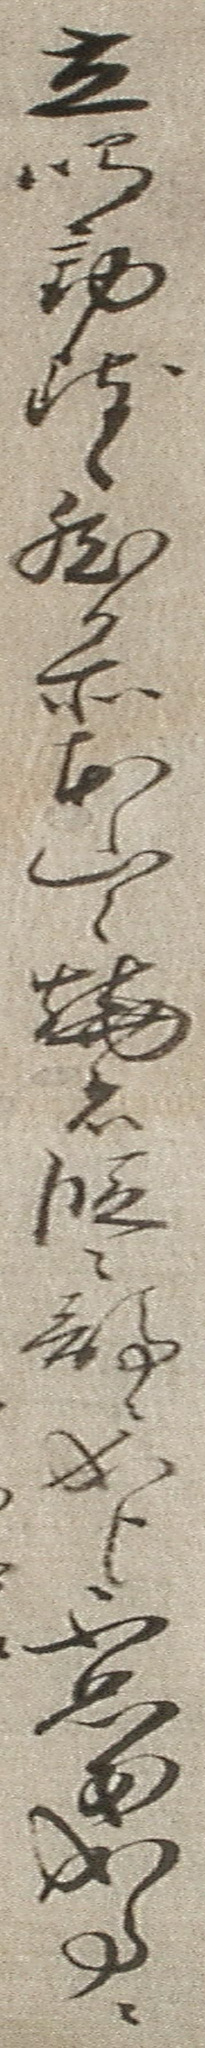立鳴動致候然る所本山之焼者段々静に成申候不思義成事に
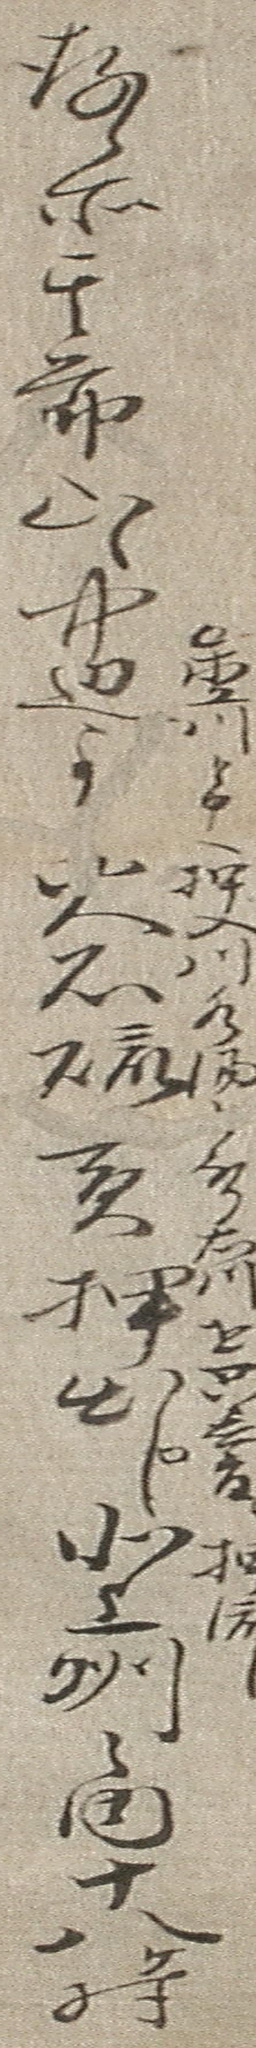存候所其節山中辺より火石硫黄押出し。北上州之内十八ヶ村
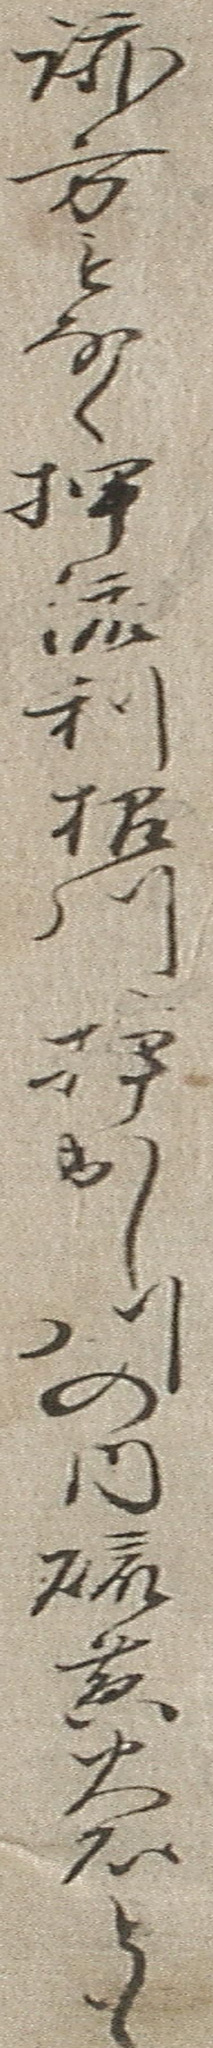跡方もなく押流利根川へ押出し川の内硫黄火石とも
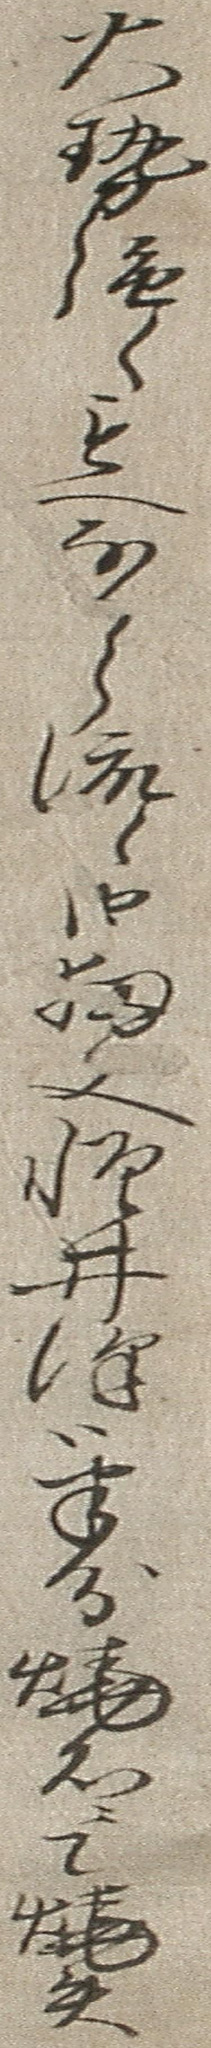火勢強くもへなから流候由扨又軽井沢は半分焼石にて焼失
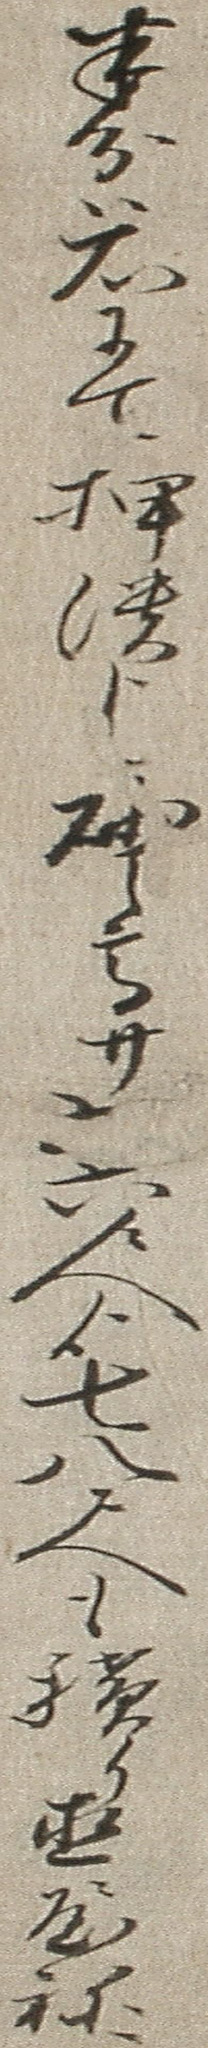半分は石にて押潰申候砂之高さ五六尺ゟ七八尺も積り直に屋ねへ
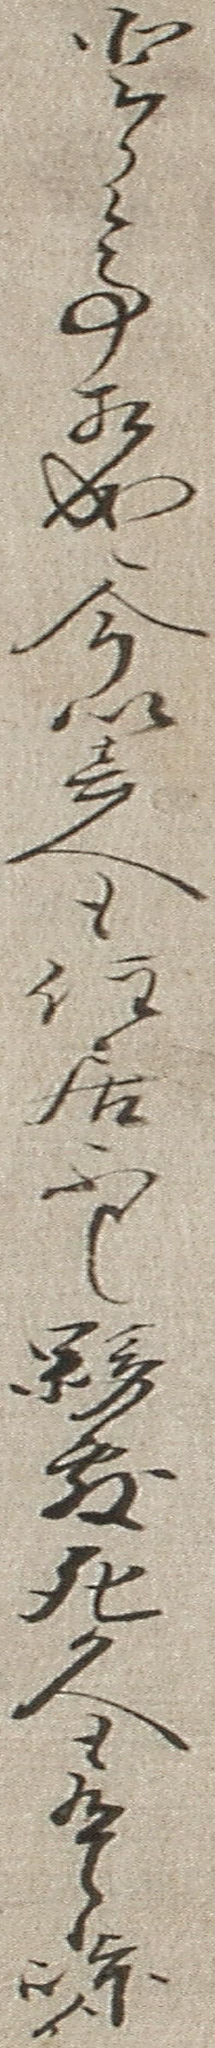登り候事相成候今以壱人も住居不申候夥敷死人も有之候峠ゟ
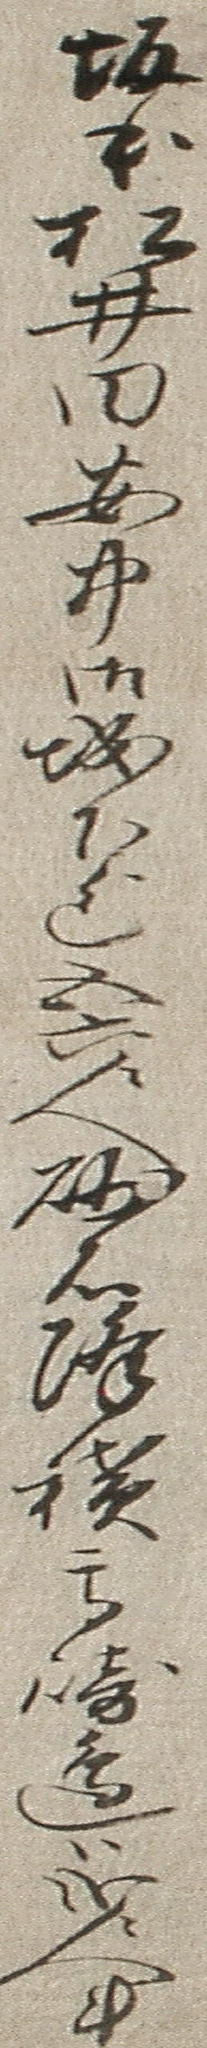坂本松井田安中御城下迄五六尺砂石降積高崎辺は弐尺斗
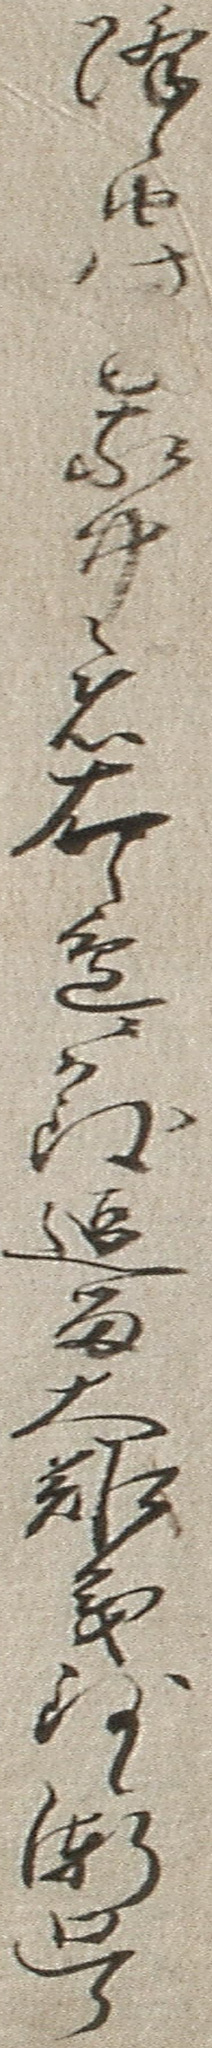降候由此家中之者右之辺に而致逗留大難義致候漸廻り
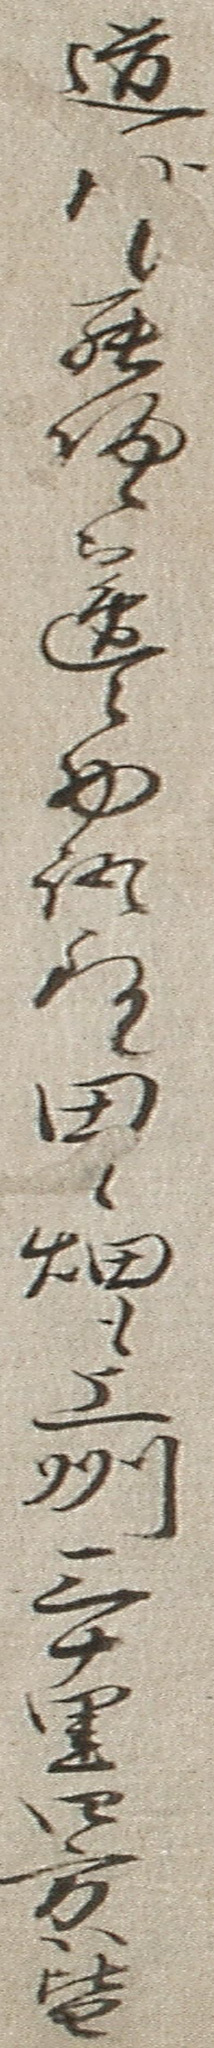道罷帰候而逢候物語致候田も畑も上州三十里四方は皆
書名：太平秘録抜書　浅間山燒及普賢山崩
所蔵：東京大学地震研究所図書室 Earthquake Research Institute Library, The University of Tokyo, JAPAN
